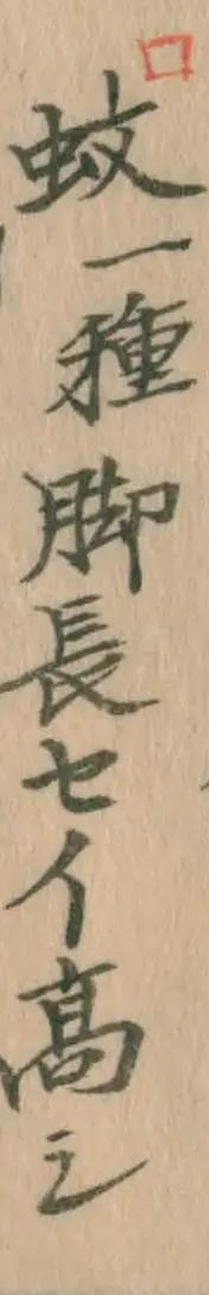蚊一種脚長セイ髙シ
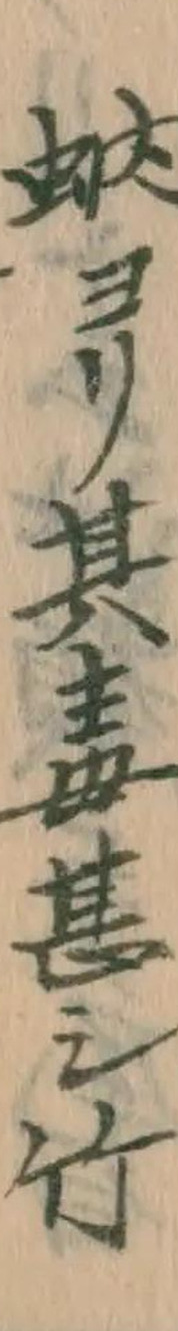蚋ヨリ其毒甚シ竹
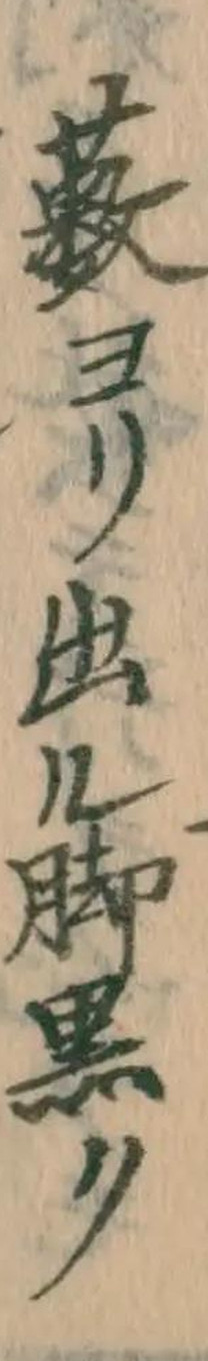藪ヨリ出ル脚黒ク
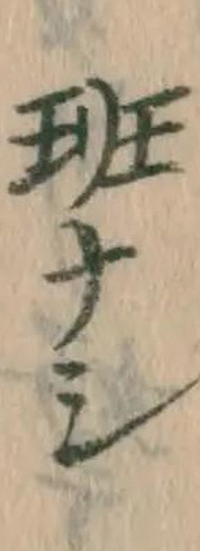班ナシ
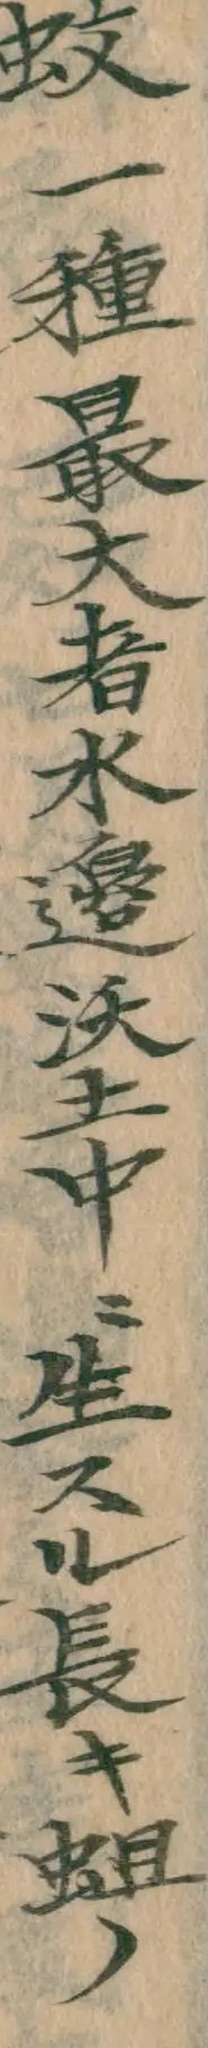蚊一種最大者水邉沃土中ニ生スル長キ蛆ノ
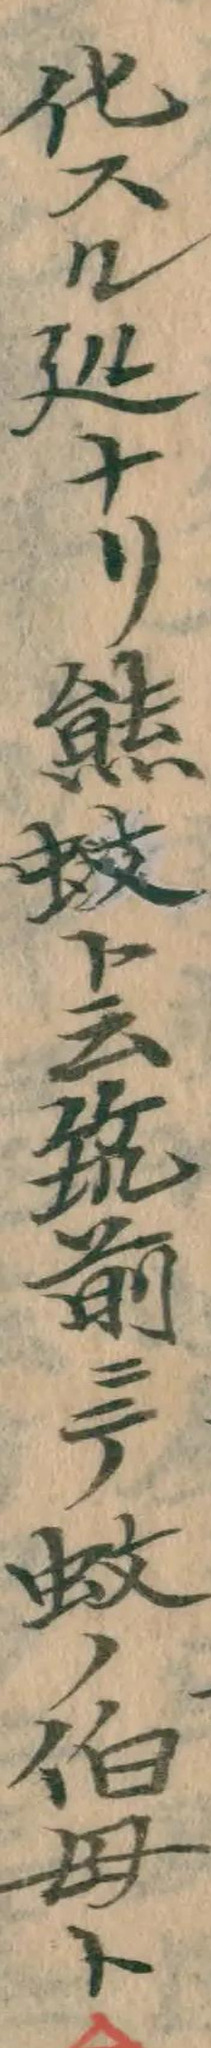化スル処ナリ熊蚊ト云筑前ニテ蚊ノ伯母ト△
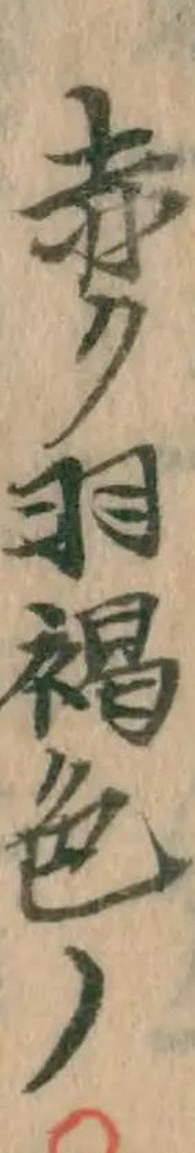赤ク羽褐色ノ〇
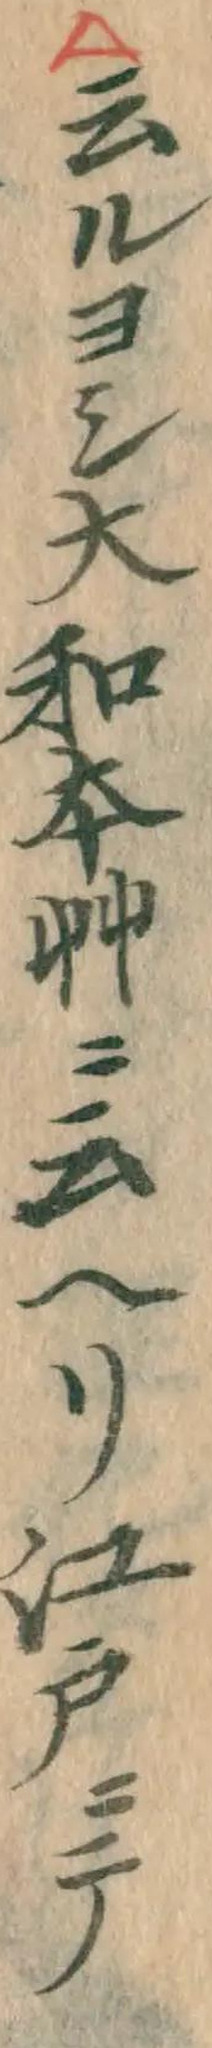△云ルヨシ大和本艸ニ云ヘリ江戸ニテ
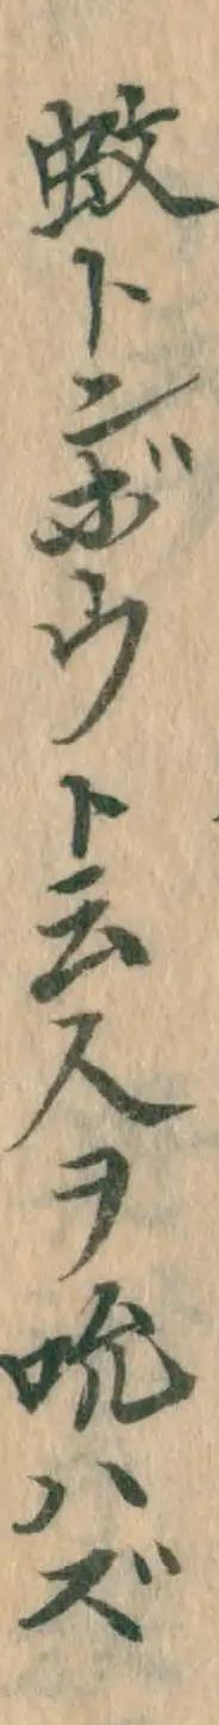蚊トンボウト云人ヲ吮ハズ
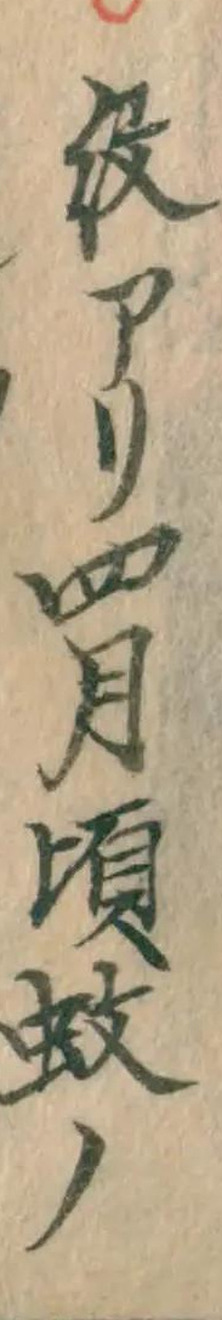〇紋アリ四月頃蚊ノ
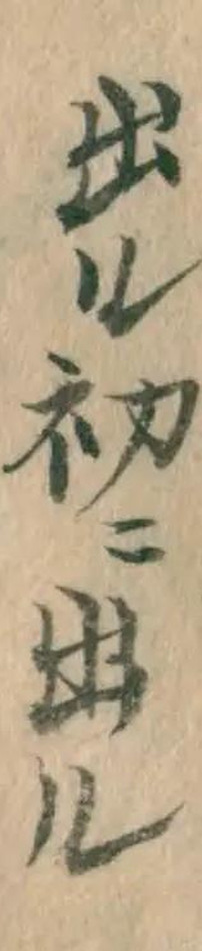出るル初ニ出ル

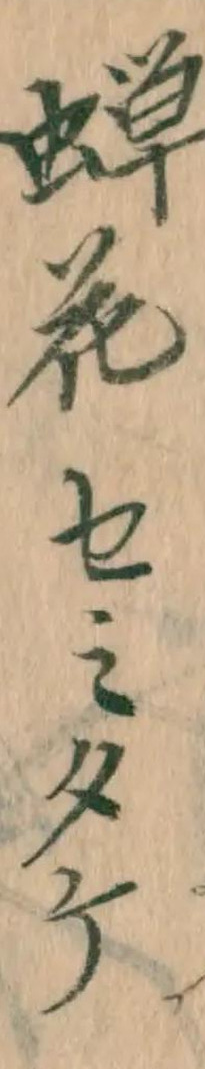蝉花セミタケ
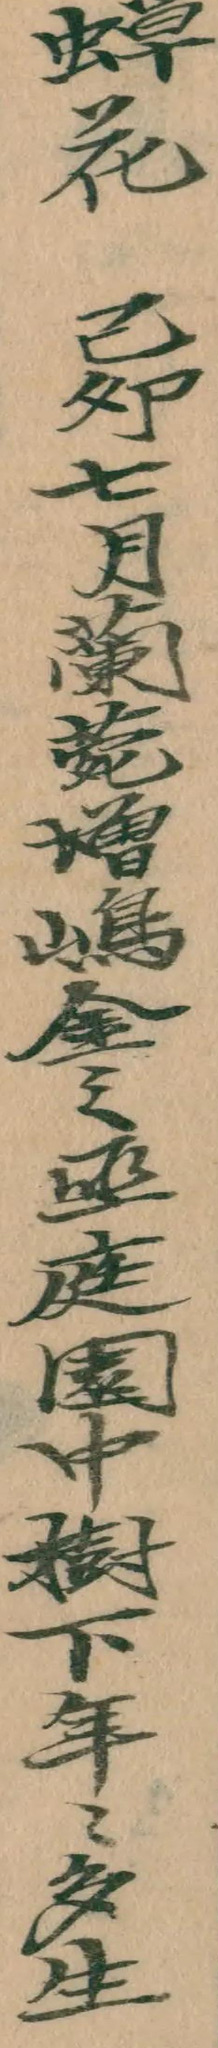蝉花己卯七月蘭菀増嶋金之丞庭園中樹下年々多生
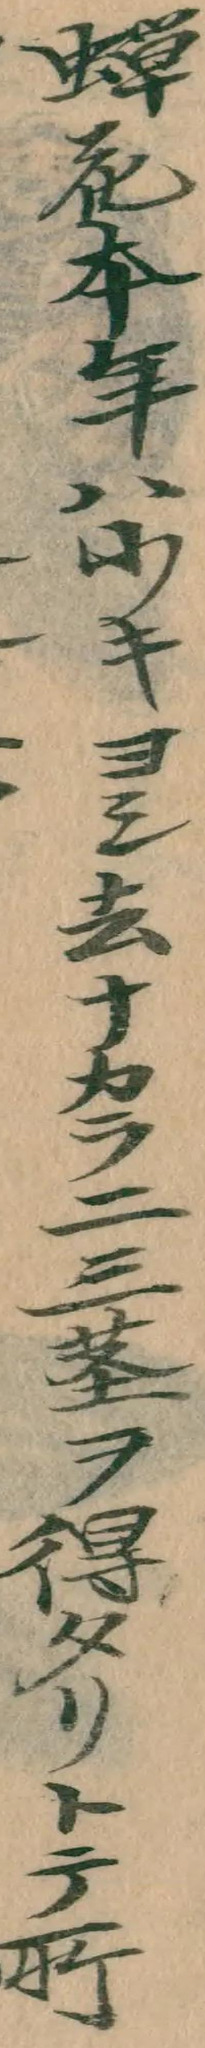蝉花本年ハ少キヨシ去ナカラ二三茎ヲ得タリトテ所
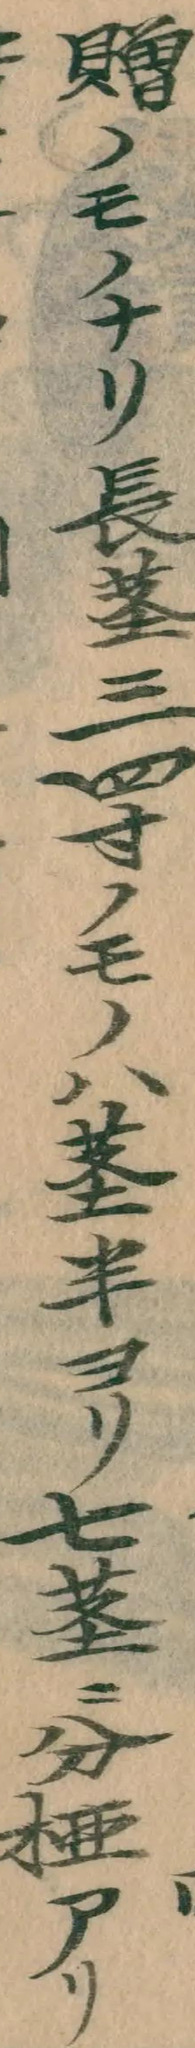贈ノモノナリ長茎三四寸ノモノハ茎半ヨリ七茎ニ分椏アリ
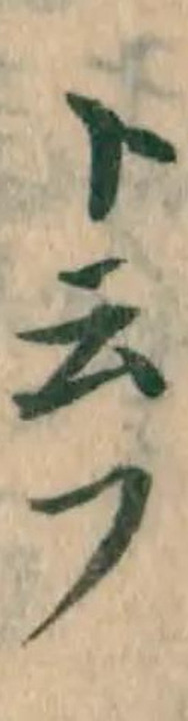ト云フ
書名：千蟲譜 3巻. [2]
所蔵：国立国会図書館 National Diet Library, JAPAN
